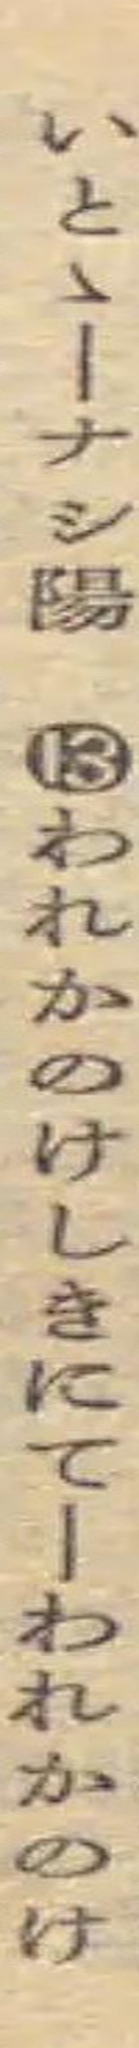いとゝ―ナシ陽⓭われかのけしきにて―われかのけ
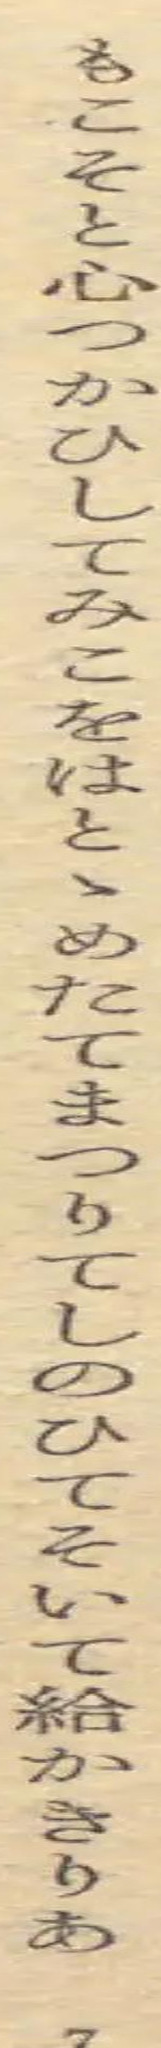もこそと心つかひしてみこをはとゝめたてまつりてしのひてそいて給かきりあ
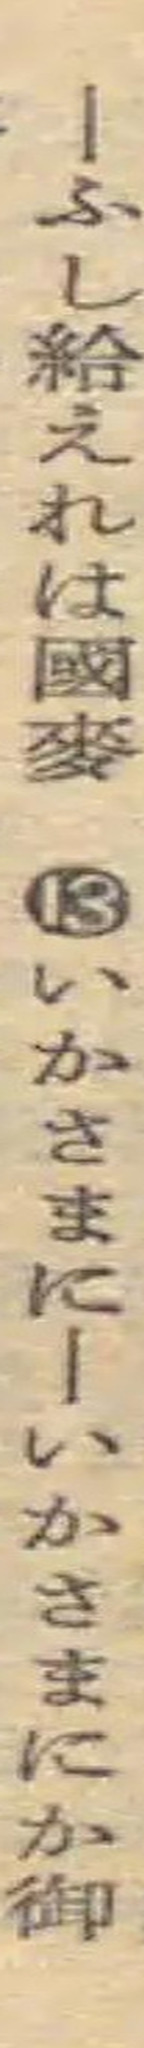―ふし給えれは国麦⓭いかさまに―いかさまにか御
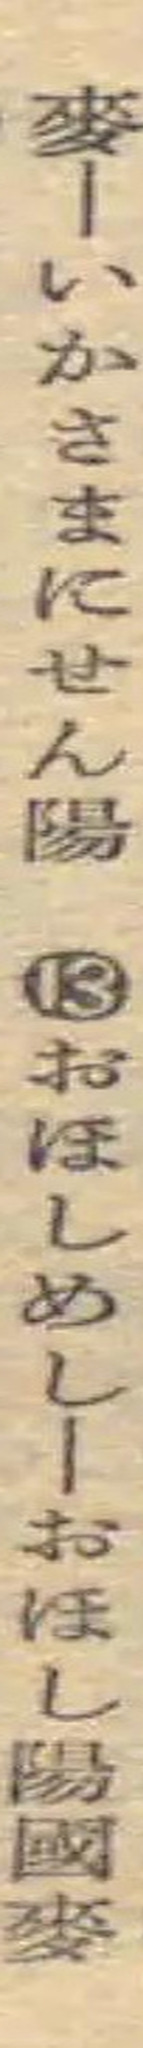麦―いかさまにせん陽⓭おほしめし―おほし陽国麦
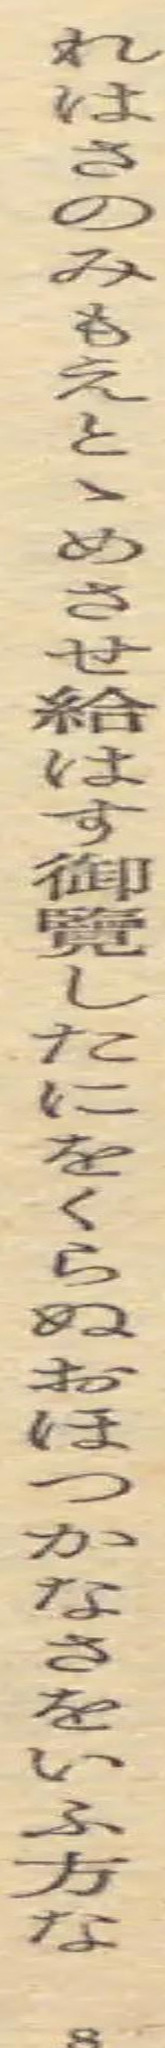れはさのみもえとゝめさせ給はす御覧したにをくらぬおほつかなさをいふ方な
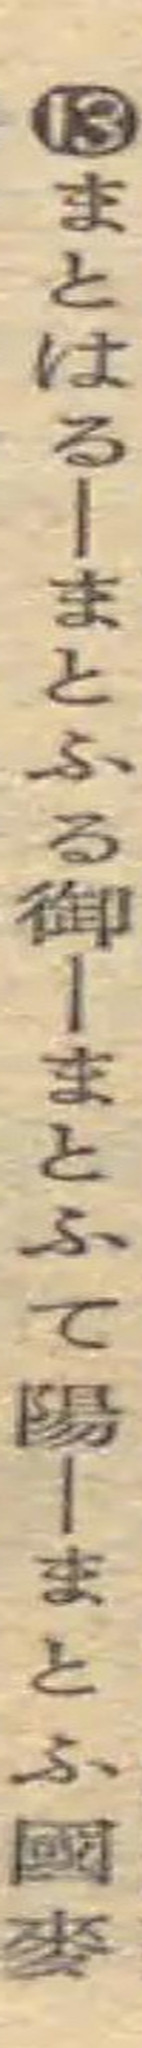⓭まとはる―まとふる御―まとふて陽―まとふ国麦
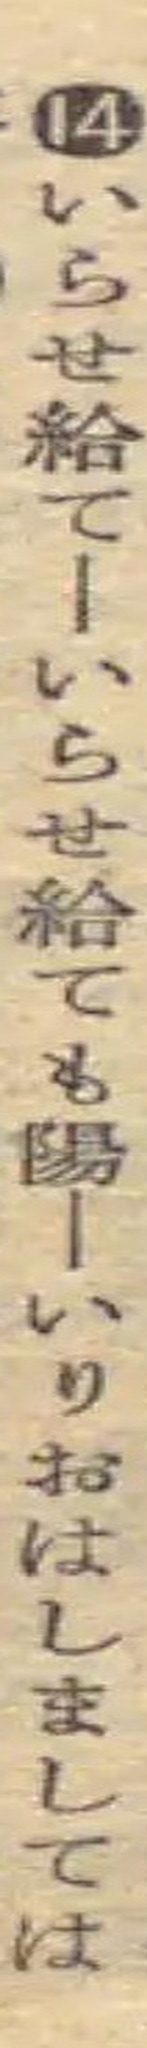⓮いらせ給て―いらせ給ても陽―いりおはしましては
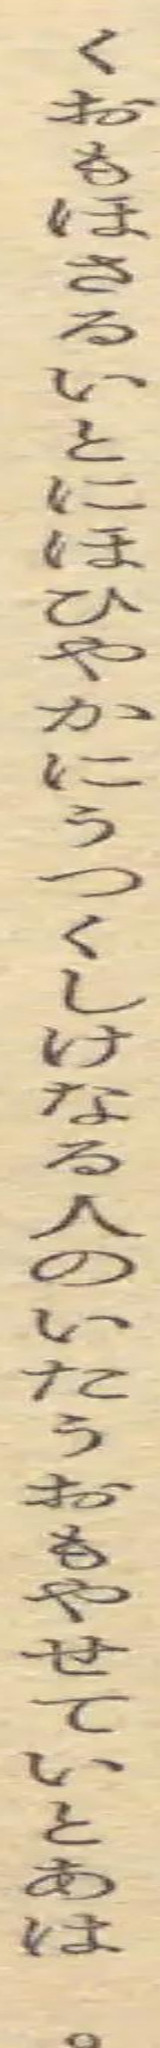くおもほさるいとにほひやかにうつくしけなる人のいたうおもやせていとあは
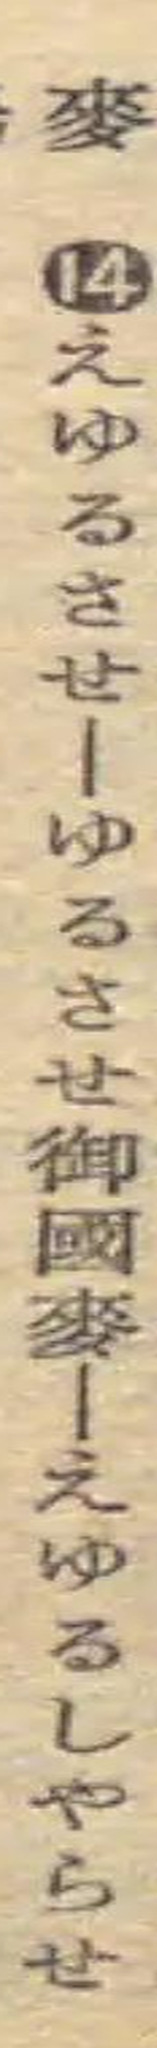麦⓮えゆるさせ―ゆるさせ御国麦―えゆるしやらせ
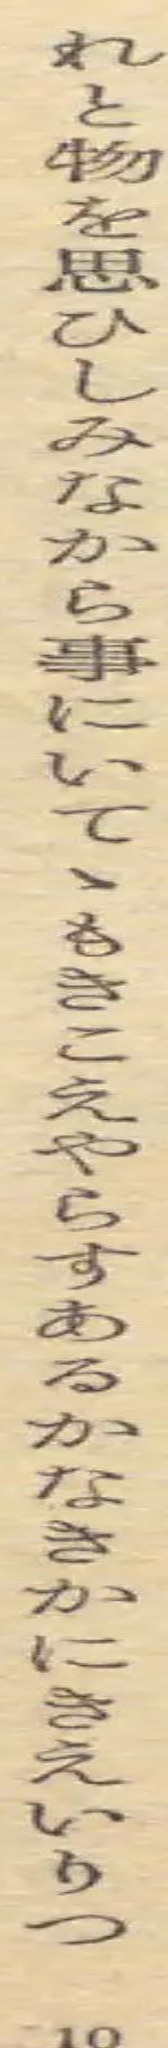れと物を思ひしみなから事にいてゝもきこえやらすあるかなきかにきえいりつ
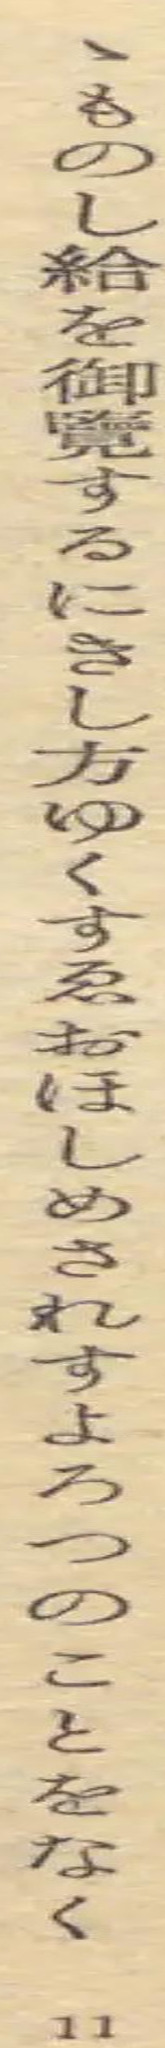ゝものし給を御覧するにきし方ゆくすゑおほしめされすよろつのことをなく
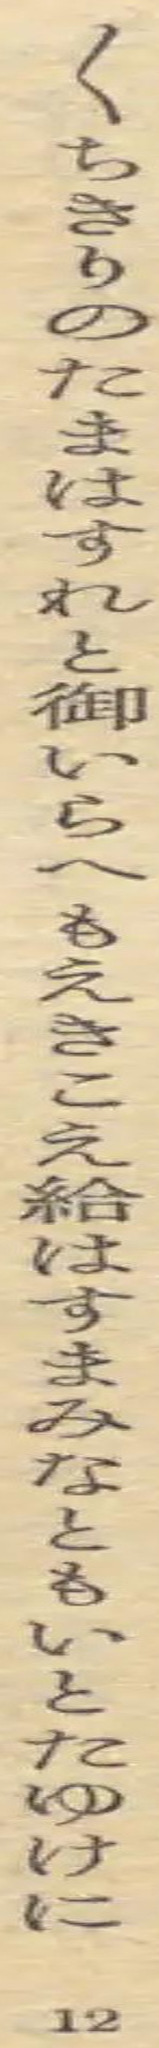〳〵ちきりのたまはすれと御いらへもえきこえ給はすまみなともいとたゆけに
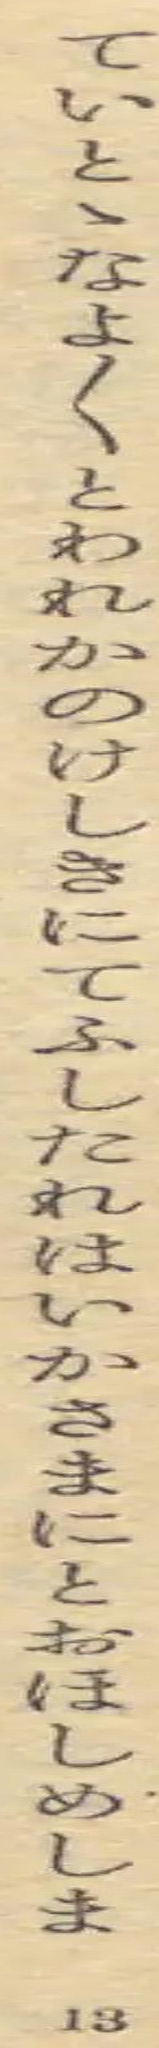ていとゝなよ〳〵とわれかのけしきにてふしたれはいかさまにとおほしめしま
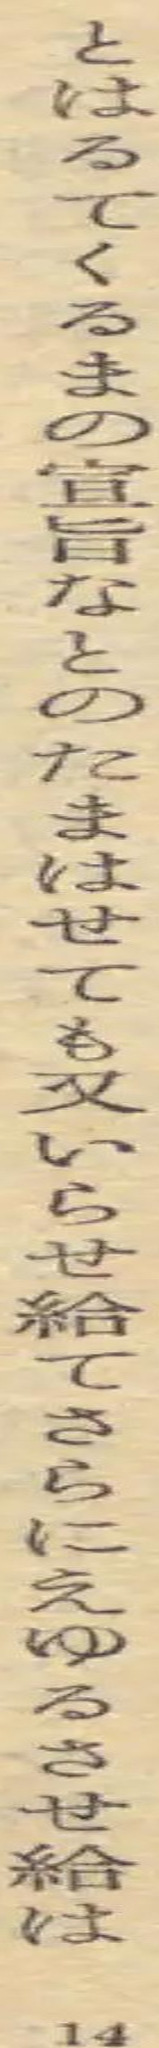とはるてくるまの宣旨なとのたまはせても又いらせ給てさらにえゆるさせ給は
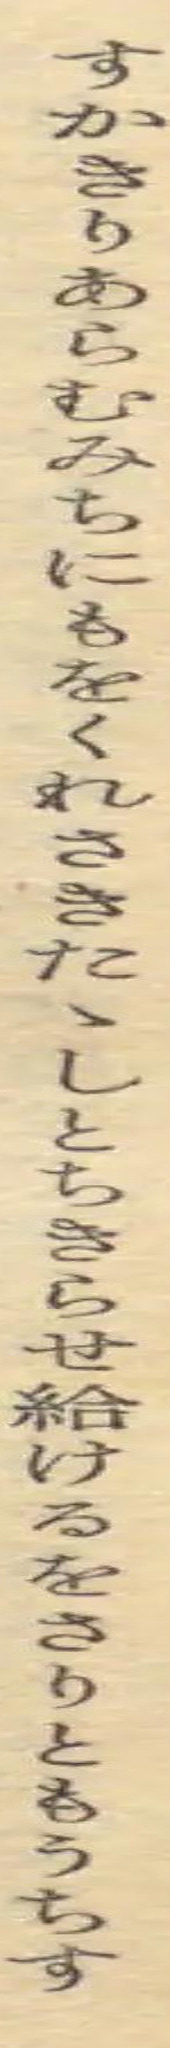すかきりあらむみちにもをくれさきたゝしとちきらせ給けるをさりともうちす
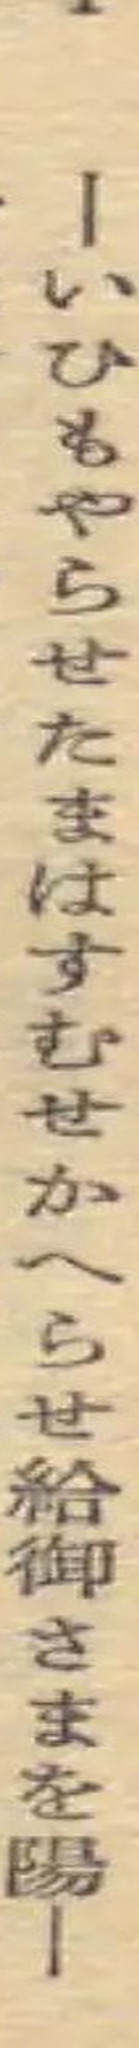―いひもやらせたまはすむせかへらせ給御さまを陽―
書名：校異源氏物語.
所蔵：国立国会図書館 National Diet Library, JAPAN
